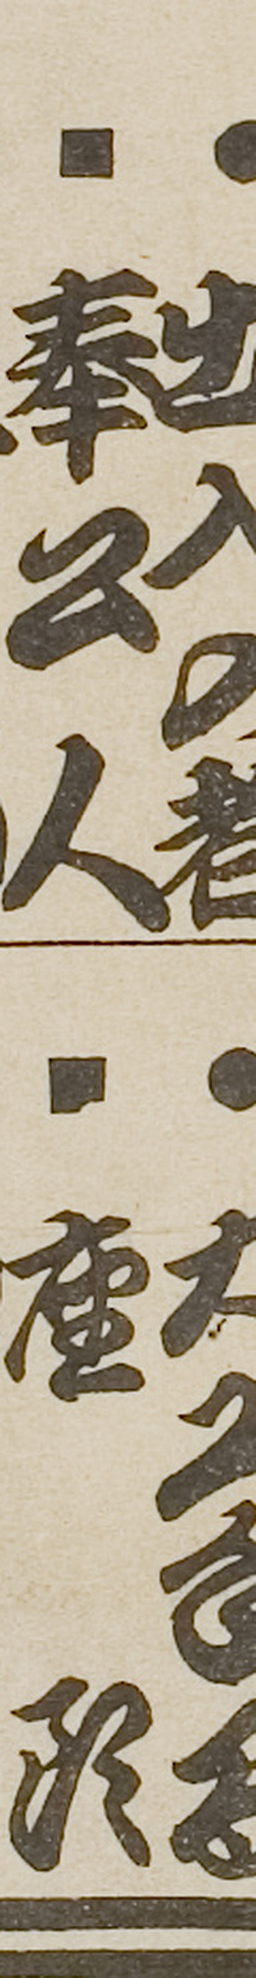▲奉公人
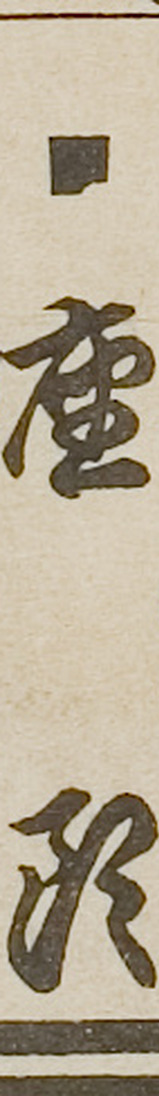▲座頭
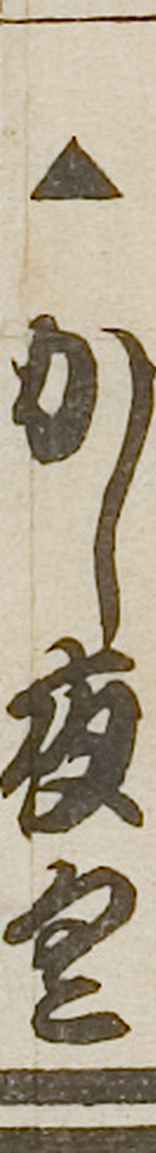かし夜具
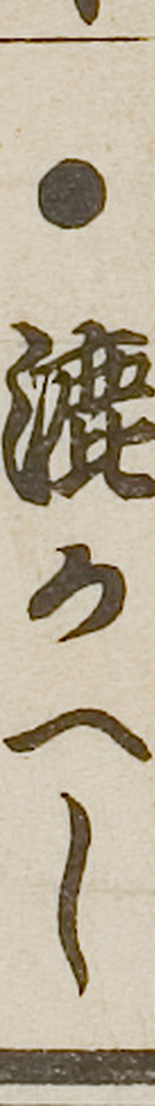●漉かへし
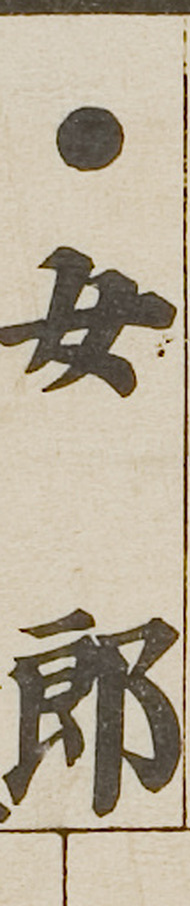●女郎
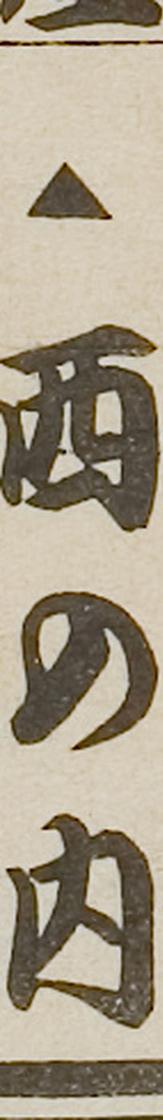西の内
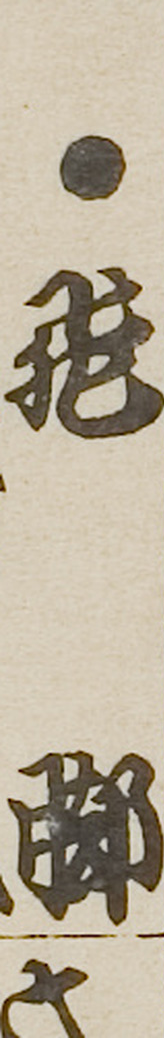●飛脚
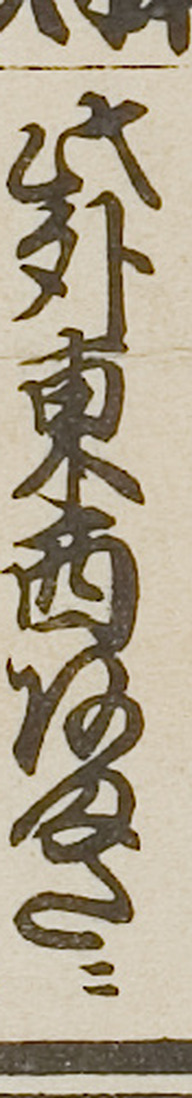此外東西あまたニ
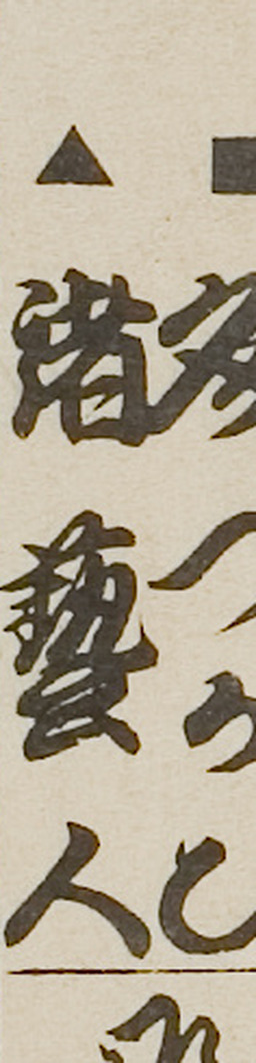諸藝人
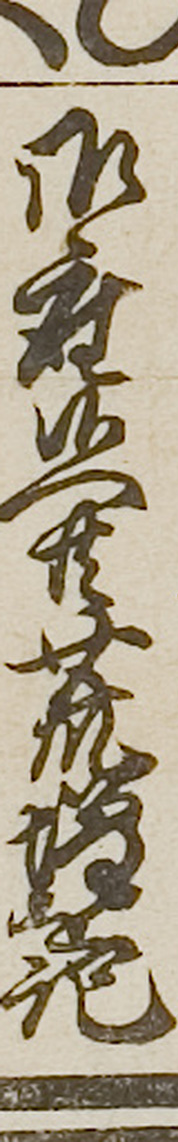御座候へ共荒増を記
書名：江戸大地震当座見立三人生酔
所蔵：東京大学総合図書館 General Library in the University of Tokyo, JAPAN
